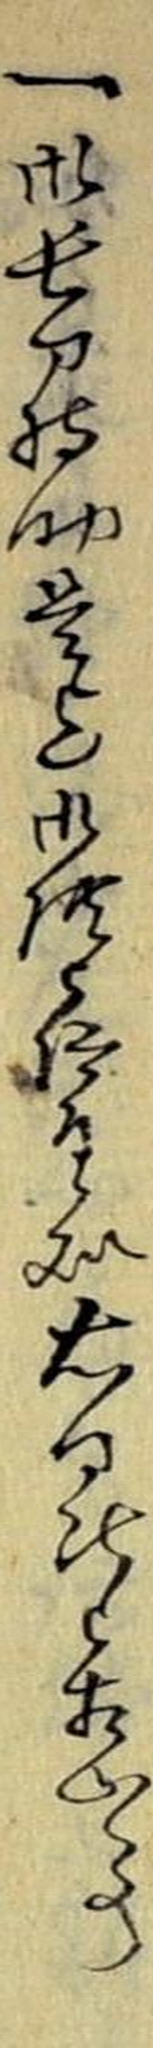一御長刀持助是迄御供被仰付候処右同断被相止候事
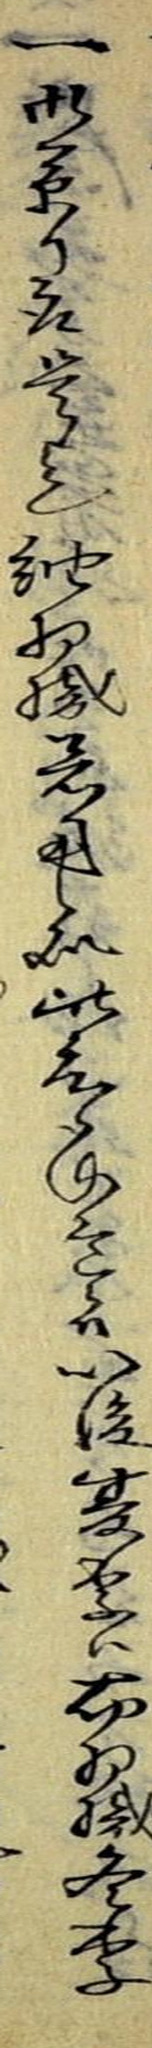一御草り取是迄紬羽織着用之処此度御趣意に付以後夏季は布羽織冬季
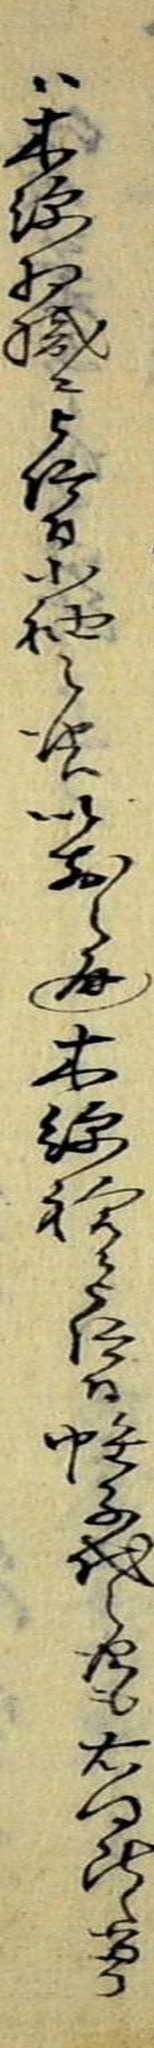は木綿羽織に被仰付小袖之儀は以前之通木綿袷に被仰付帷子代之儀も右同断之当り
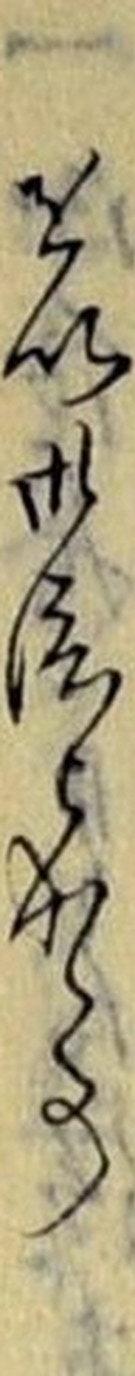を以御渡被成候事
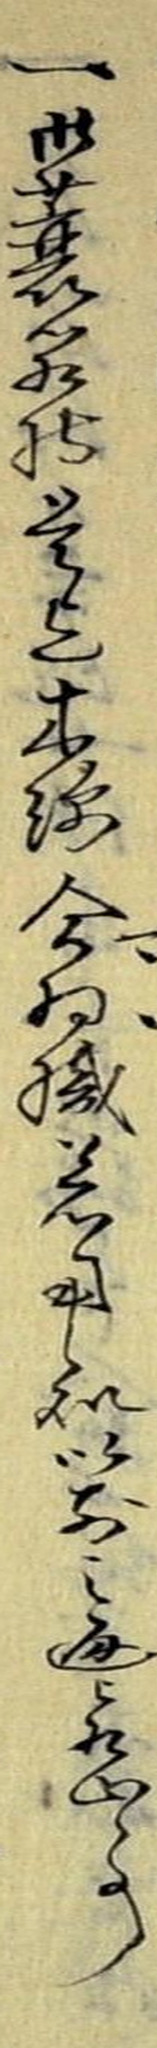一御蓑箱持是迄木綿合羽織着用之処以前之通被相止候事
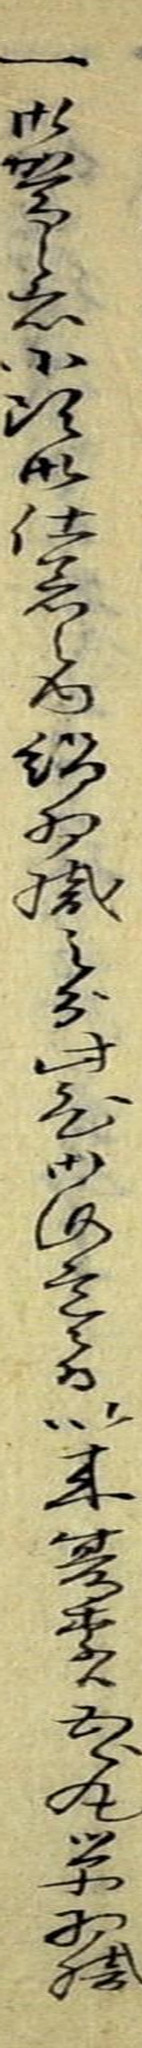一御駕之者小頭御仕着之内絽羽織之分此度御趣意に付以來夏季は五郎丸単羽織
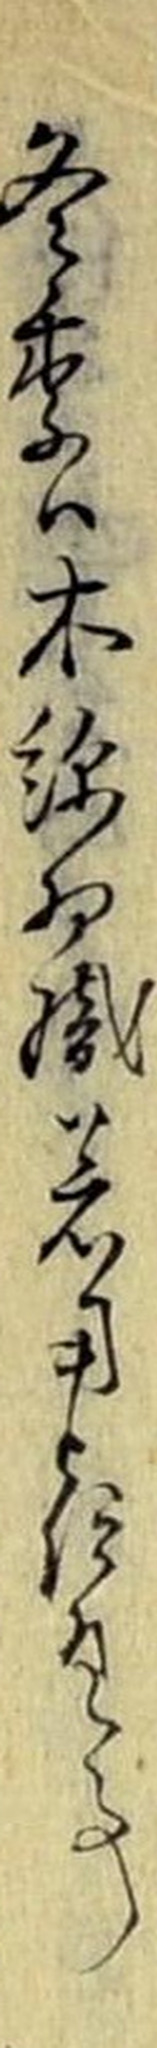冬季は木綿羽織着用被仰付候事
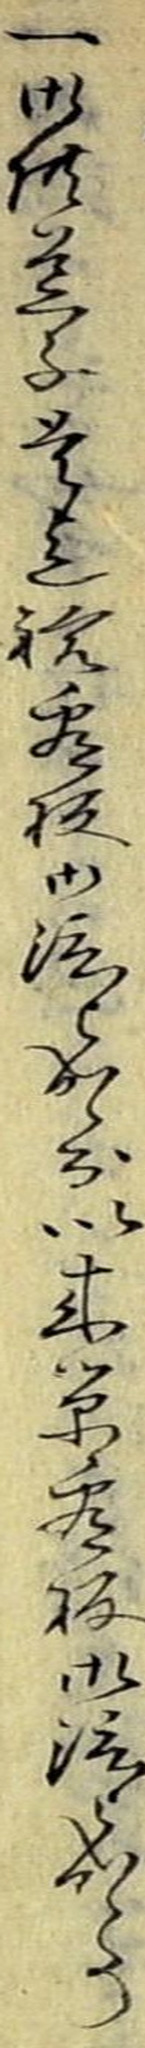一御供荒子是迄袷看板御渡被成候分以來単看板御渡被候事
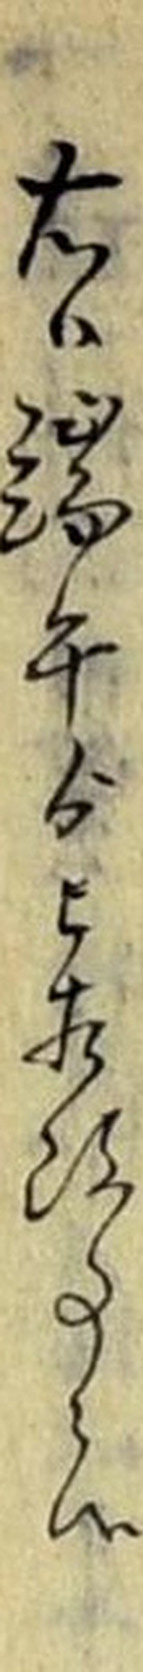右は端午ゟ被相改事に候
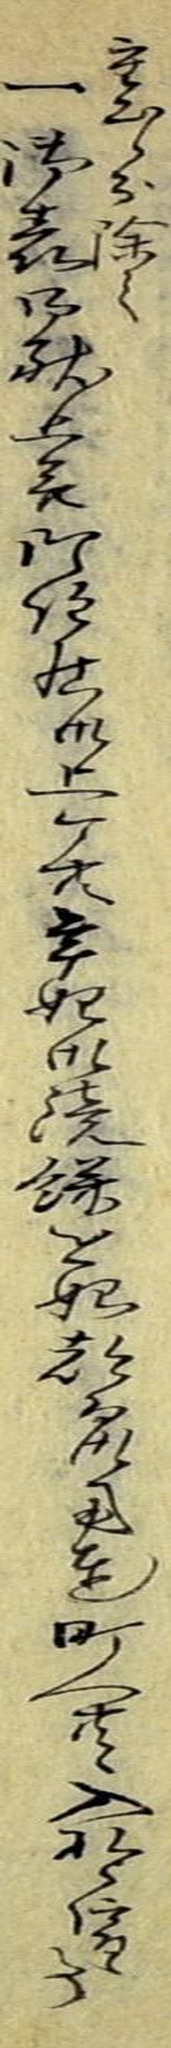一御表御献上并御住居御上ヶ共年始御鏡餅を始都而御用達町人共へ入札被仰付候事
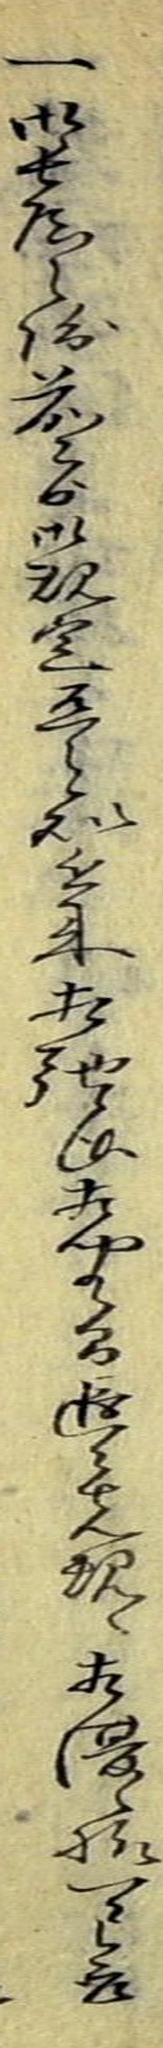一御長屋之儀前々ゟ御規定有之候処近来相弛候趣相聞候間追々先規へ相復候様可被取
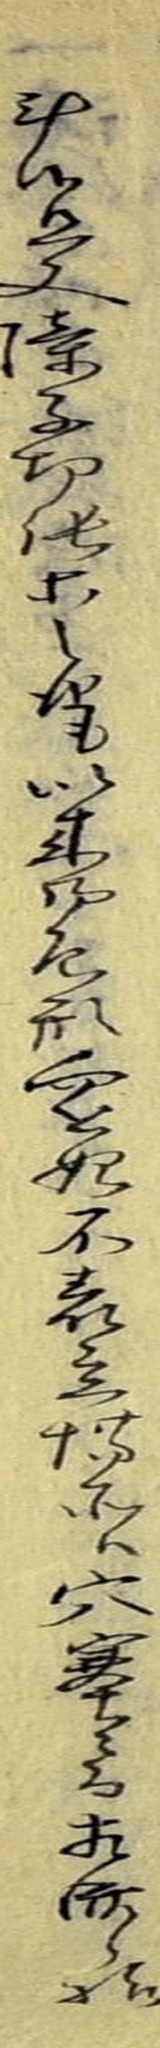斗候且又障子切張等之儀も以來御屋形向を始不表立場所は穴塞に而相済候様
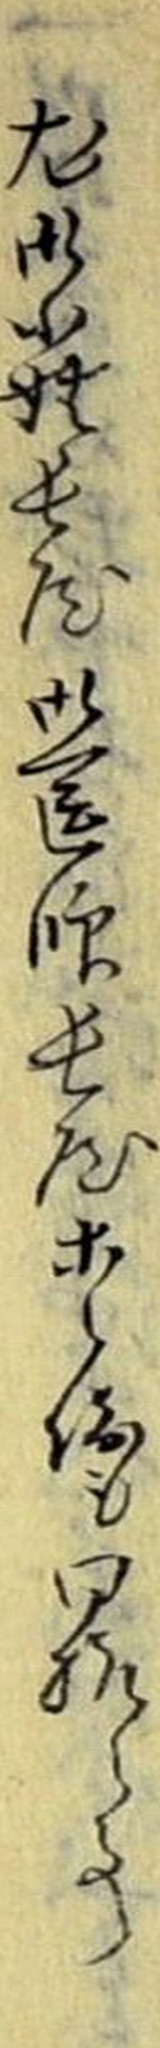尤御小姓長屋御医師長屋等之儀も同様之事

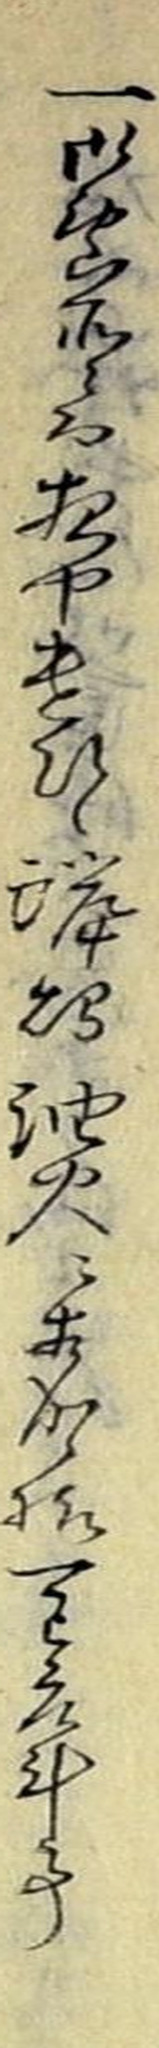一御台所に而夜中遣行候蝋燭油火に相成候様可被取斗候事
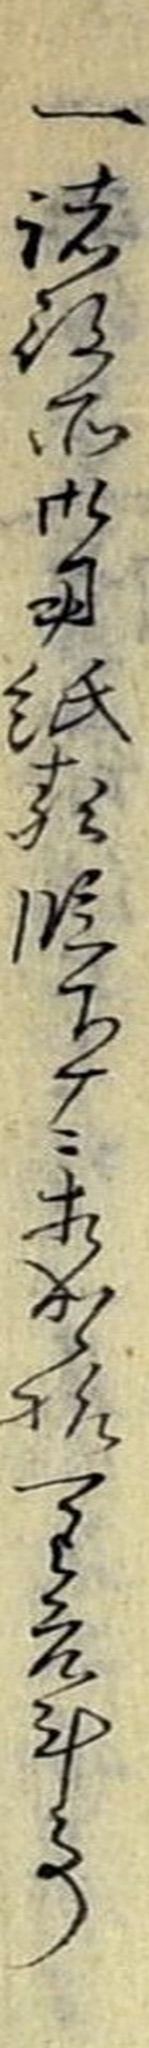一諸役所御用紙類段下ヶに相成候様可被取斗候事
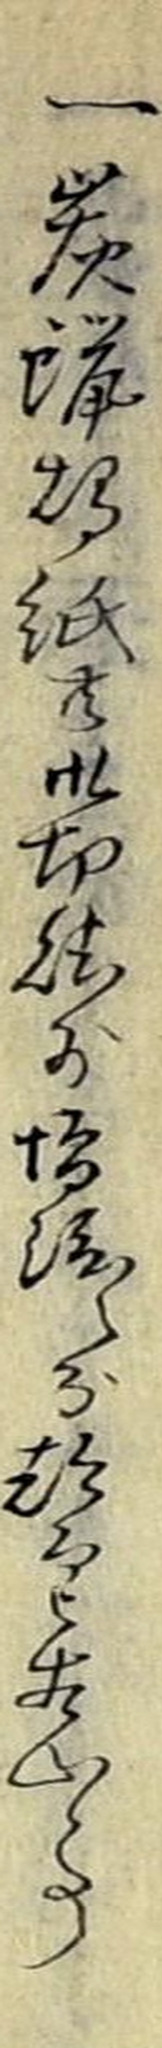一炭蝋燭紙共御切賦外増渡候分都而被相止候事
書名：命令之部 六
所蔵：福井県文書館 Fukui Prefectural Archives
